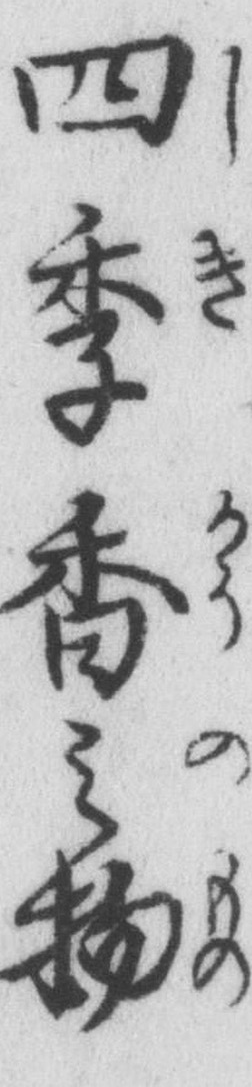四季香之物
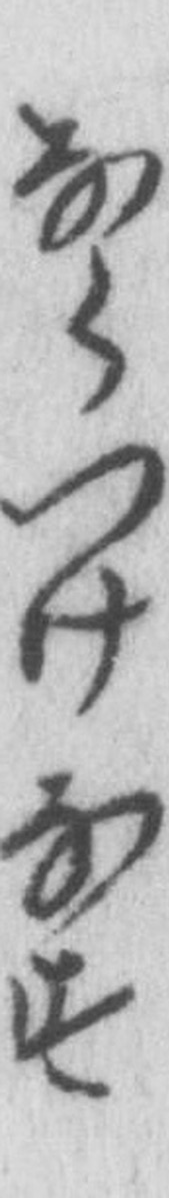ミそつけなす
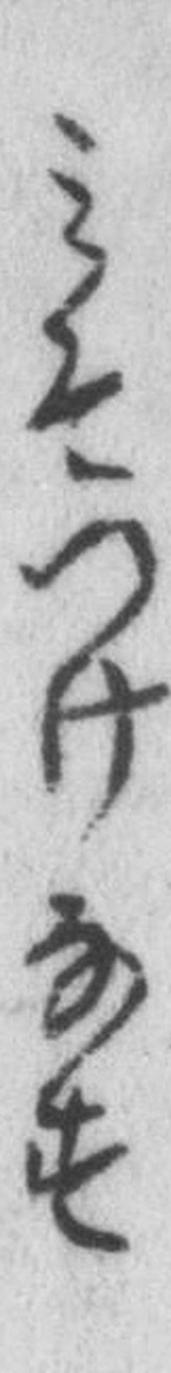ミそつけなす
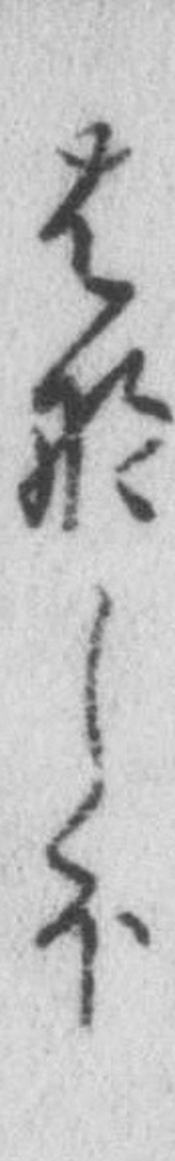はなしほ
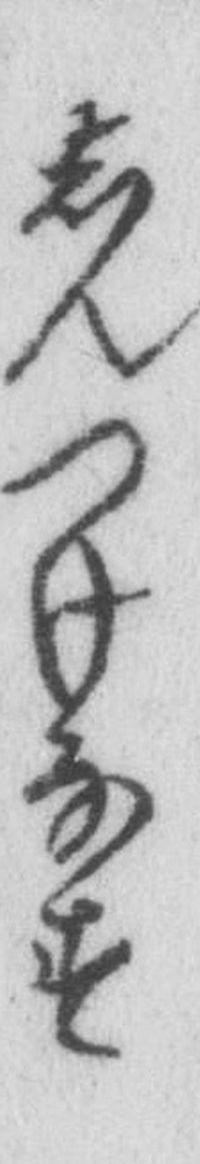ミそつけなす

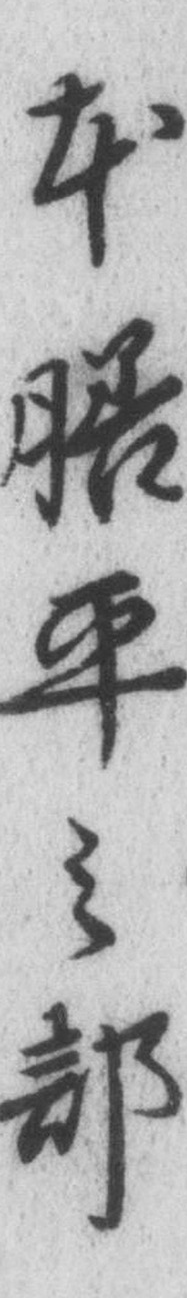本膳平之部
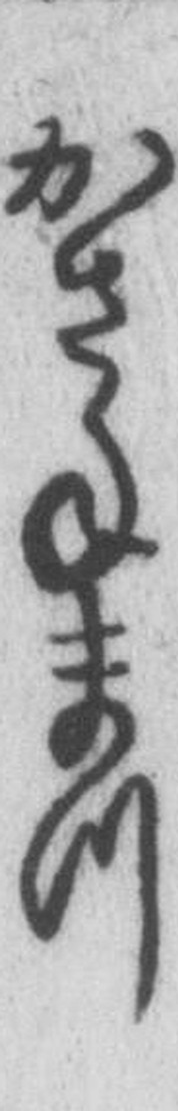かさねまつ
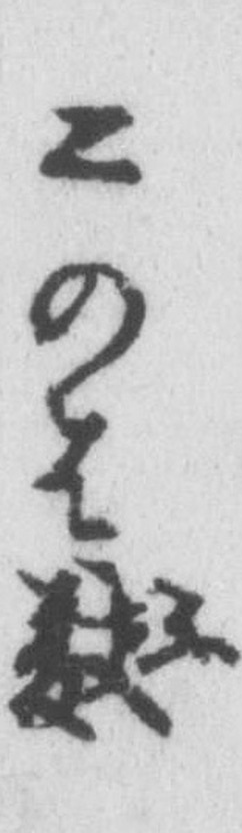このは麩
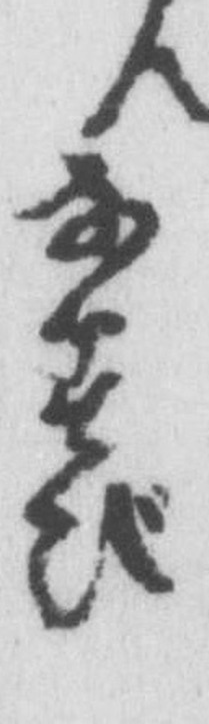なすび
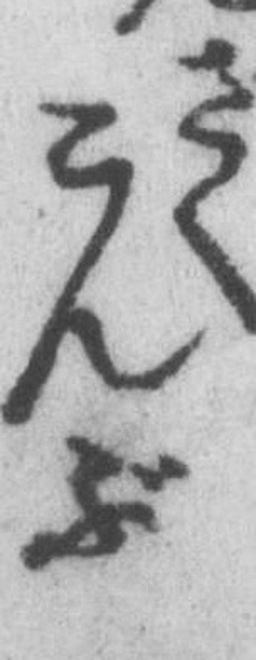こんぶ

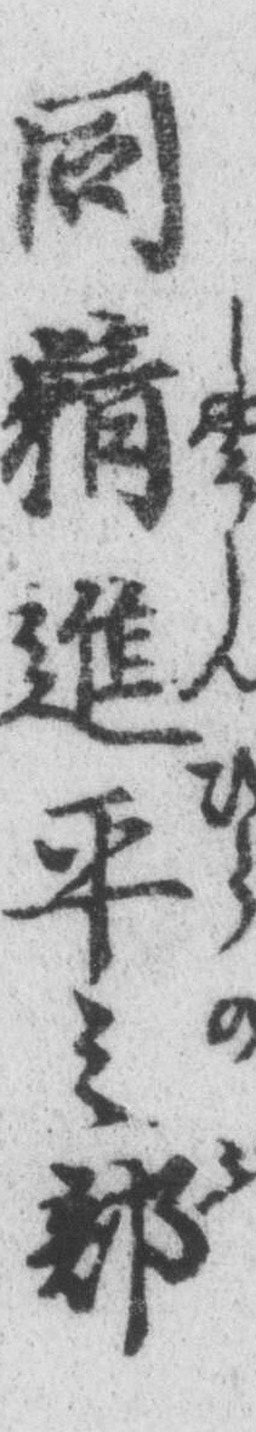同精進平乃部
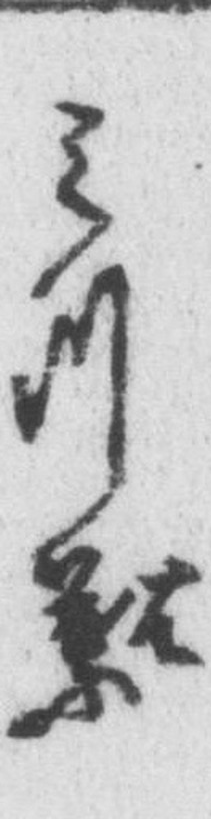三つ葉
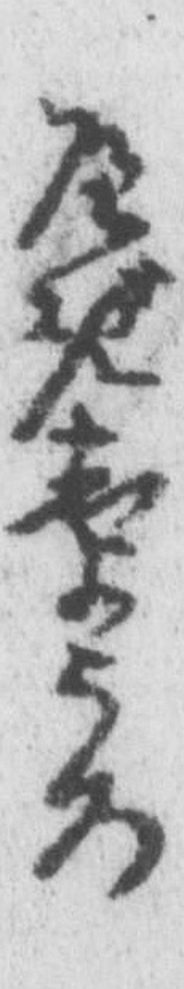へぎしようろ
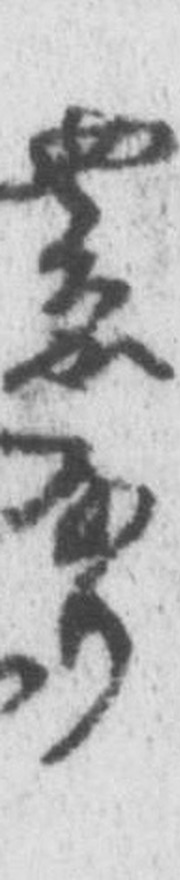やゑなり
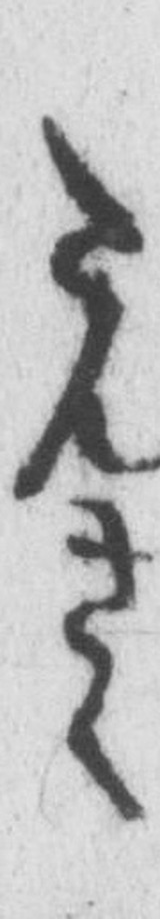たんざく
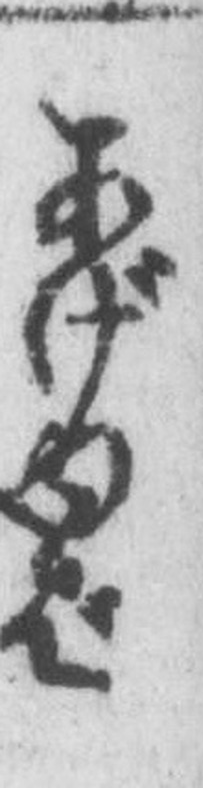あげゆば
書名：当世料理献立
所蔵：大阪府立大学学術情報センター 国文学研究資料館
